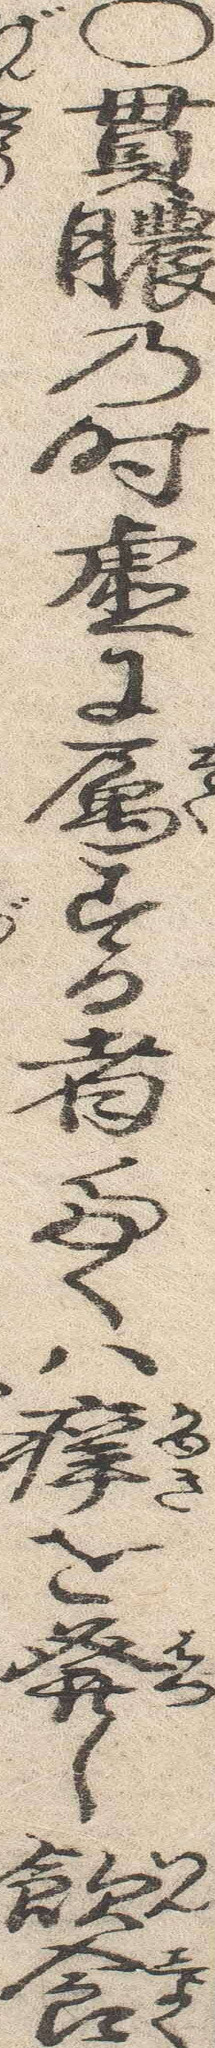貫膿の時虚に属する者多くは痒を発し飲食
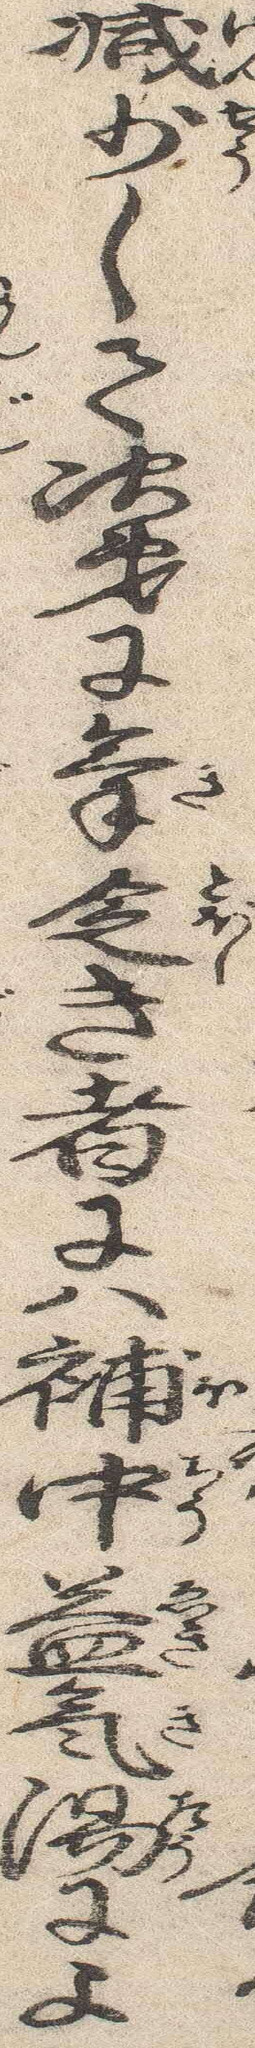減少して次第に気乏き者には補中益気湯によ
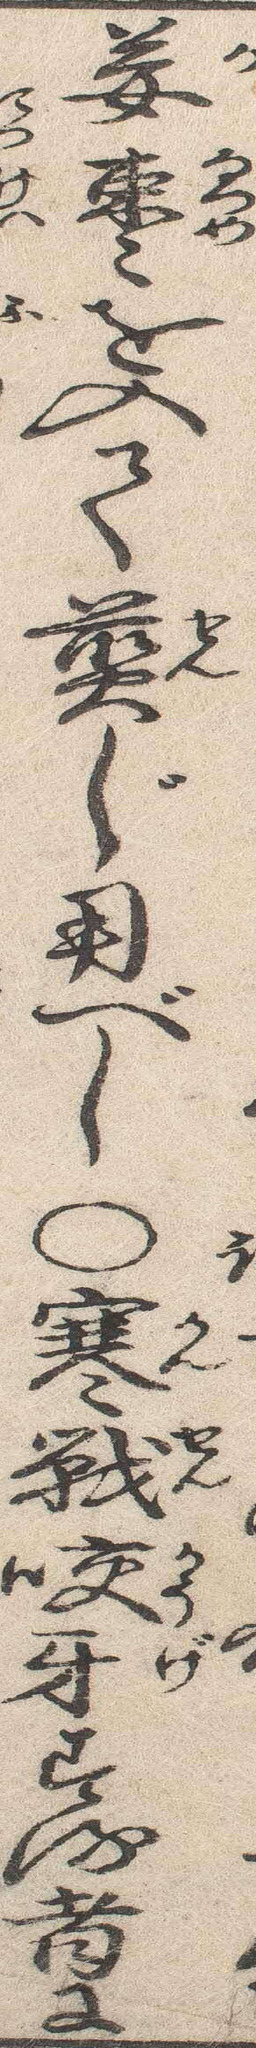姜棗を入て煎じ用べし○寒戦咬牙する者に
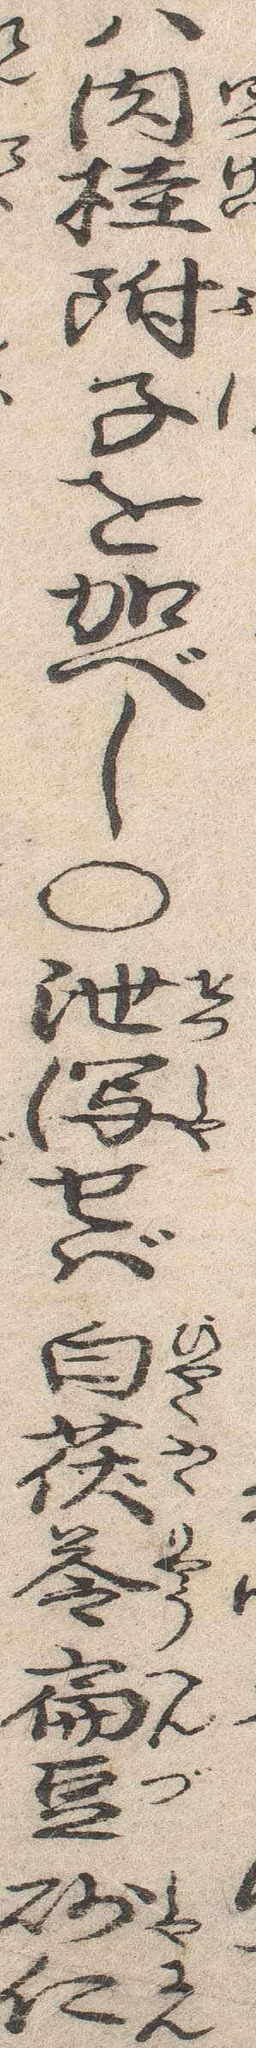は肉桂附子を加べし○泄瀉せば白茯苓扁豆砂仁
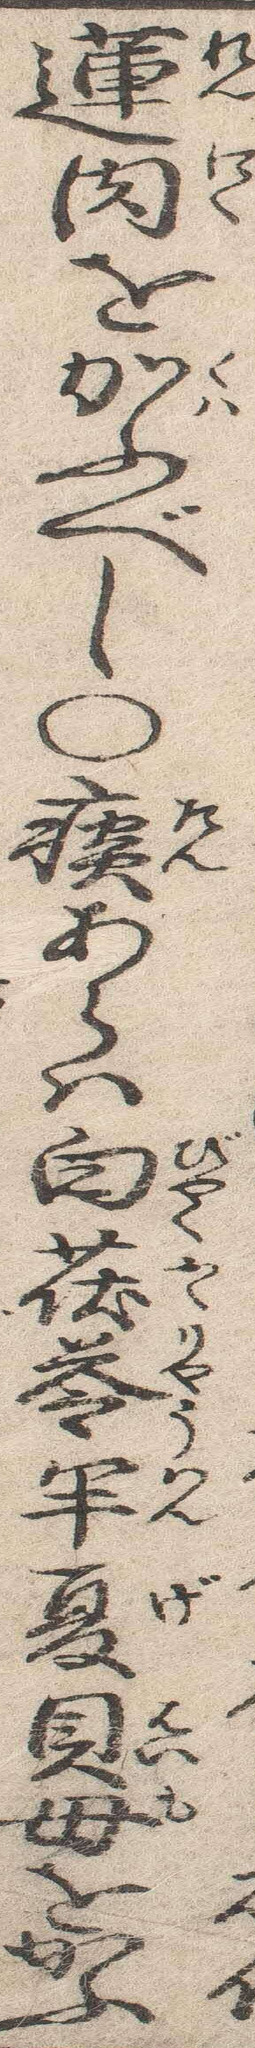蓮肉を加ふべし○痰あらは白茯苓半夏貝母を加ふ
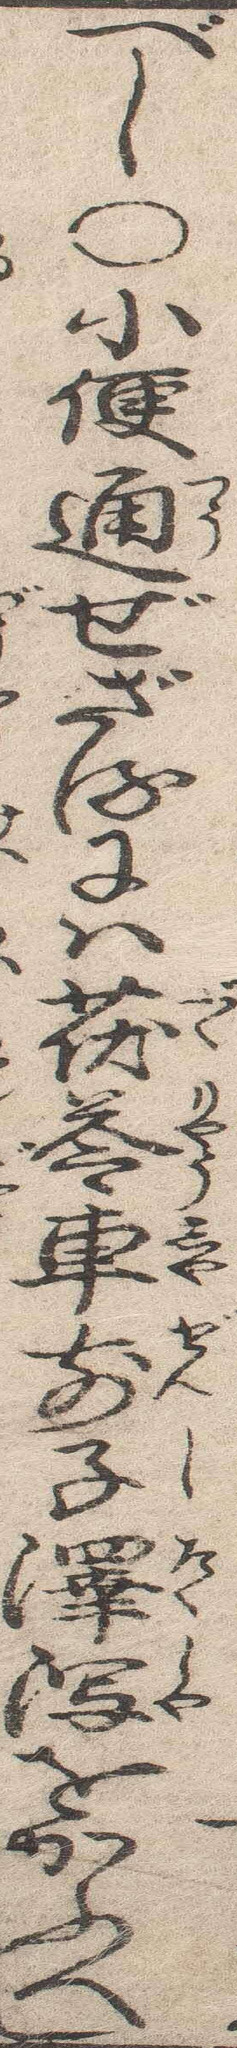べし○小便通ぜざるには茯苓車前子沢瀉を加ふへし
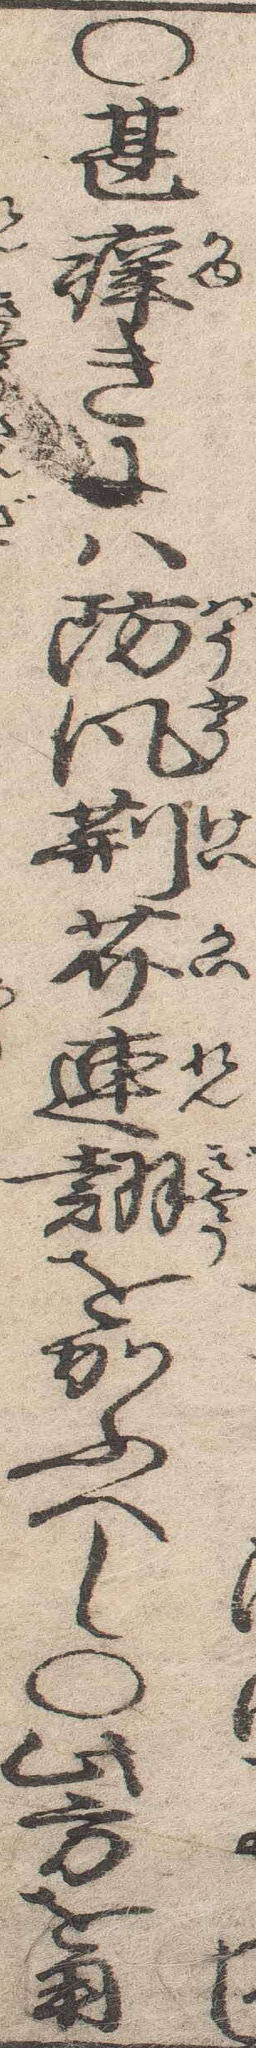○甚痒きには防風荊芥連翹を加ふへし○此方を用
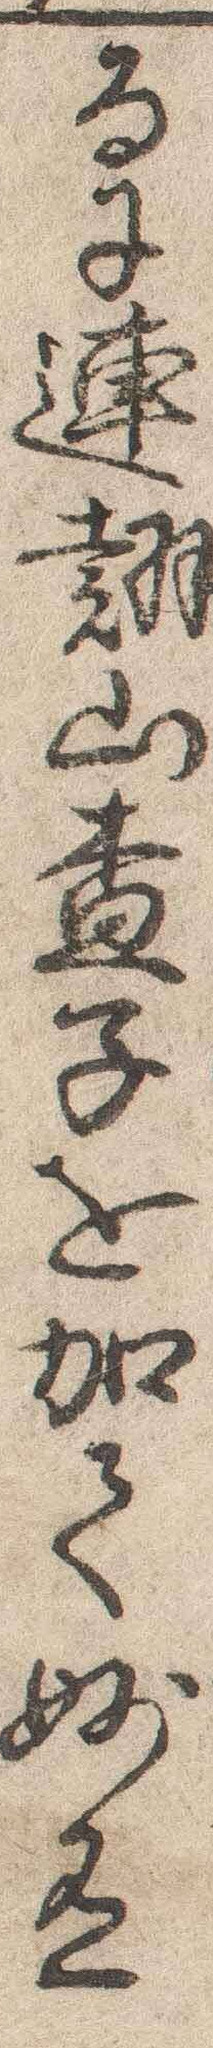るに連翹山査子を加て妙有

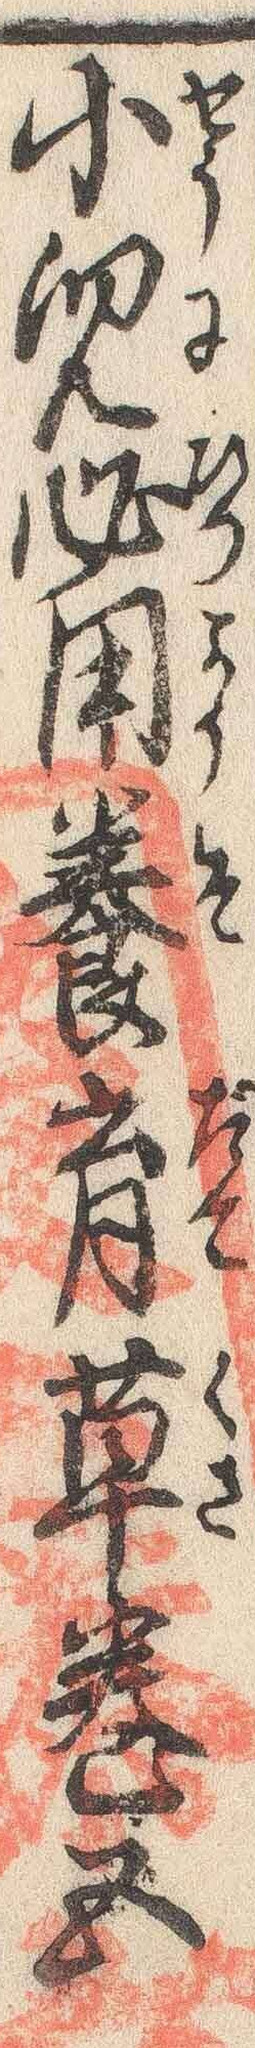小児必用養育草巻五
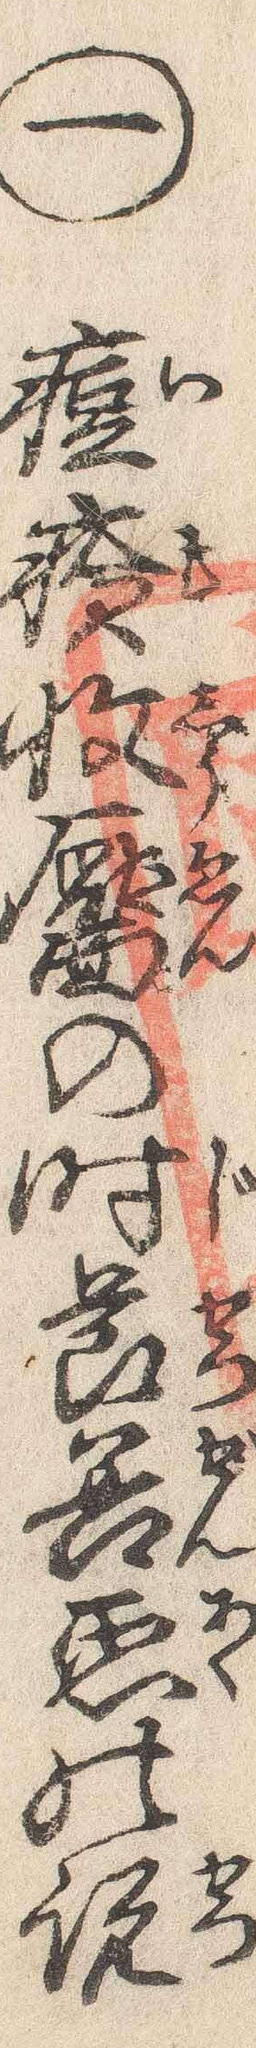㊀痘瘡収靨の時節善悪の説
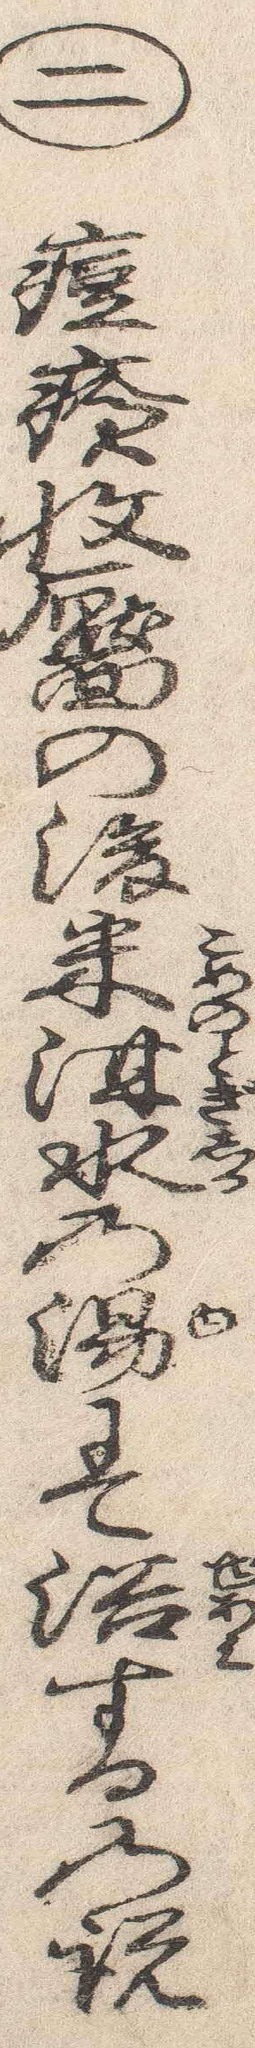㊁痘瘡収靨の後米泔水の湯にて浴するの説
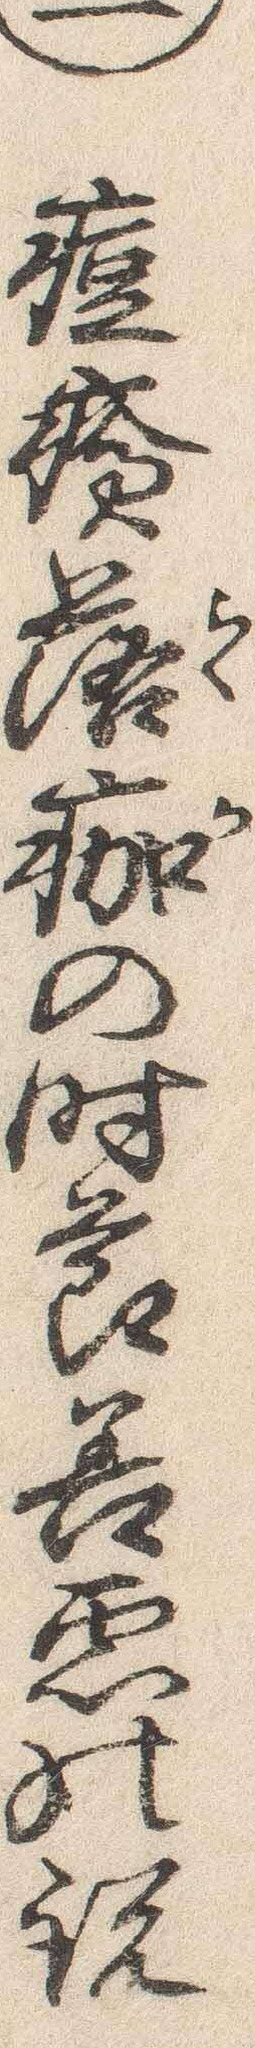㊂痘瘡落痂の時節善悪の説
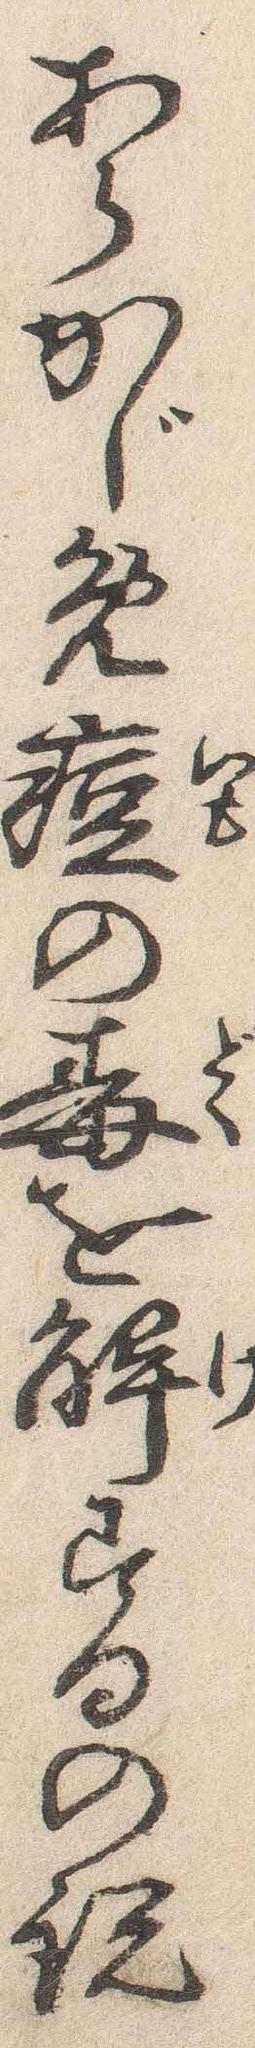㊃あらかじめ痘の毒を解するの説

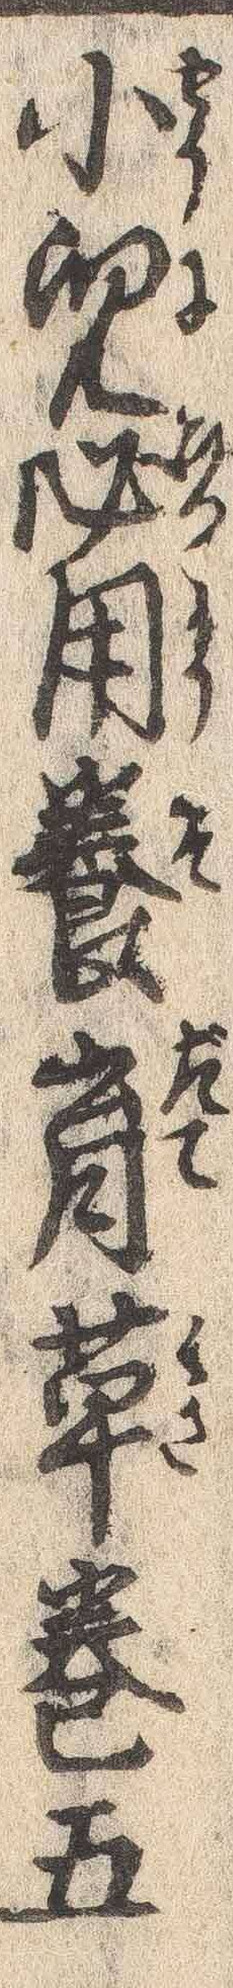小児必用養育草巻五
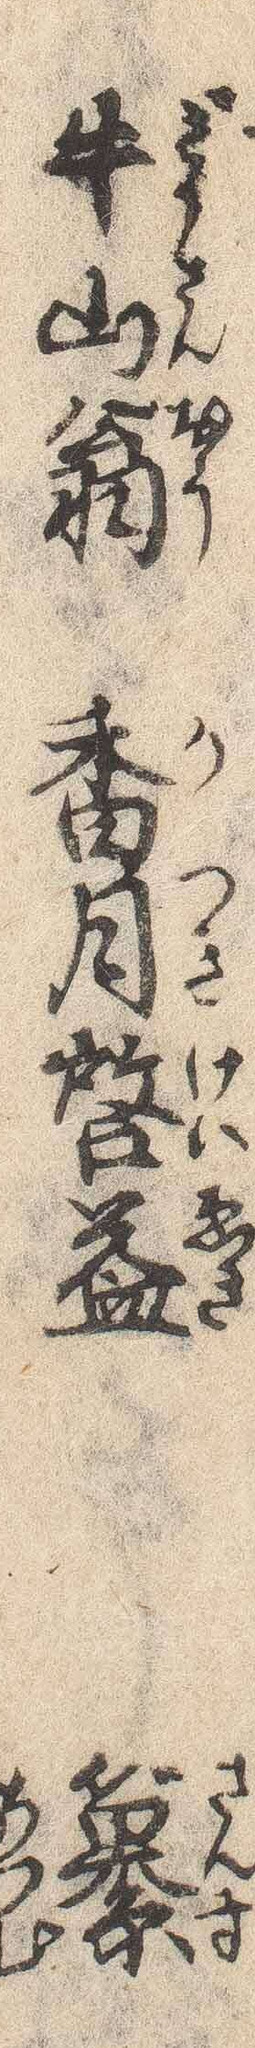牛山翁香月啓益纂
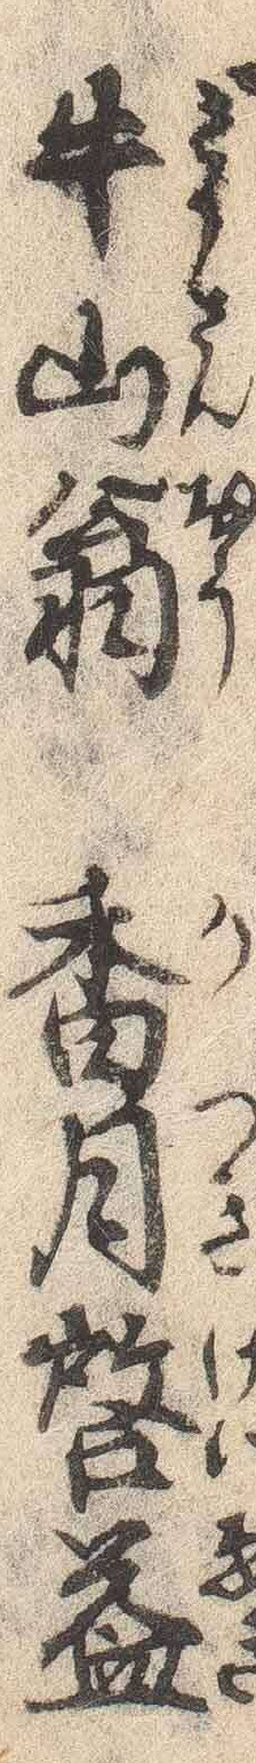牛山翁香月啓益纂
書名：小児必用養育草
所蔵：東京学芸大学附属図書館 国文学研究資料館
